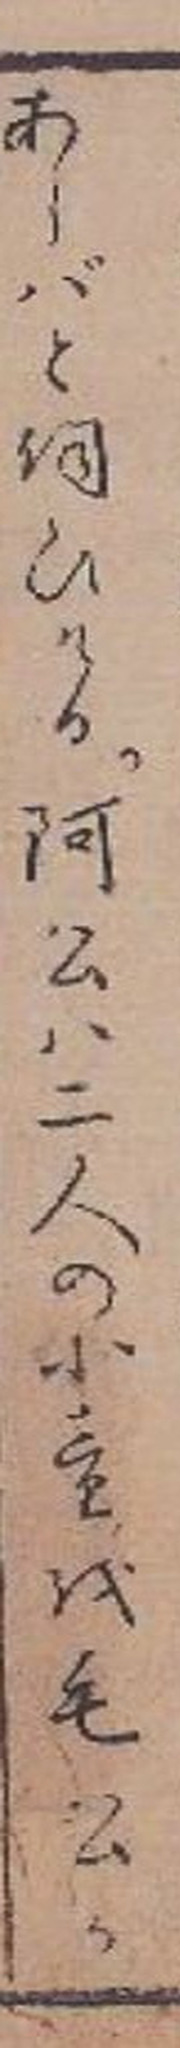あらばと伺ひける、阿公は二人の小童を毛公か

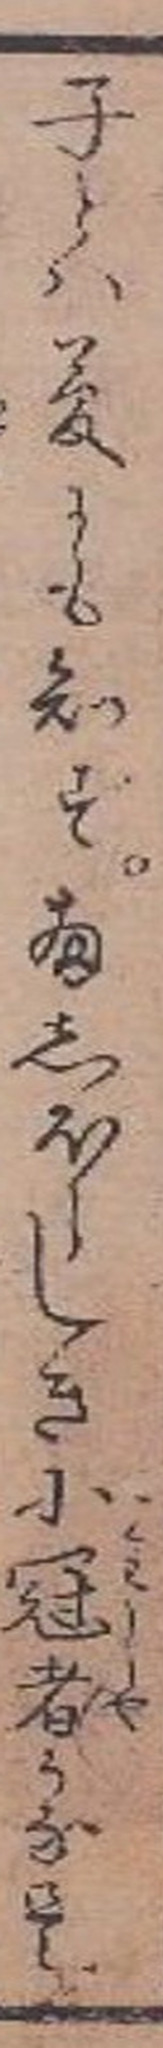子とは夢にも知ず、扨しほらしき小冠者かな是
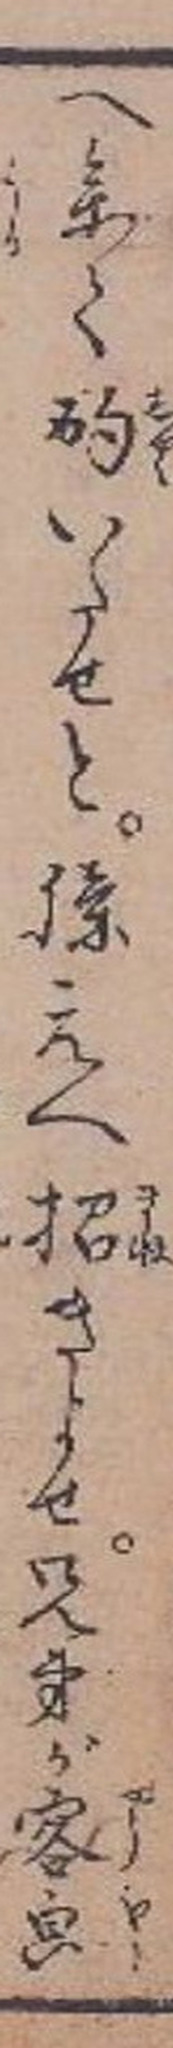へ参て酌いたせと、膝元へ招きよせ、兄弟が容皃
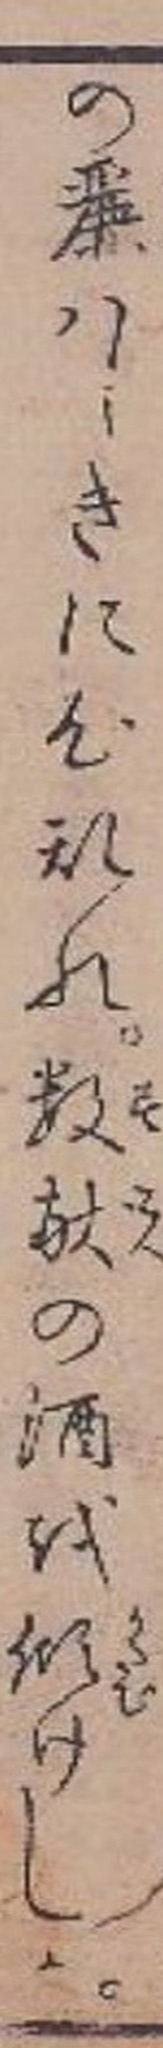の麗はしきに心乱れ、数献の酒を傾けしか、
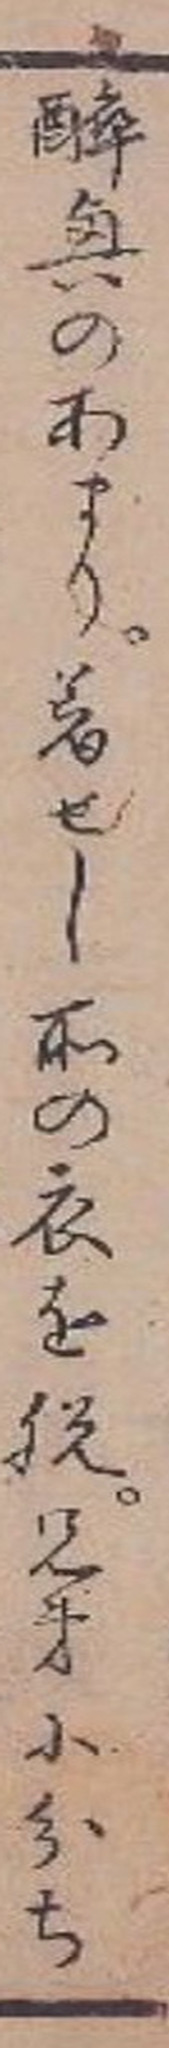酔興のあまり、着せし所の衣を脱、兄弟に分ち
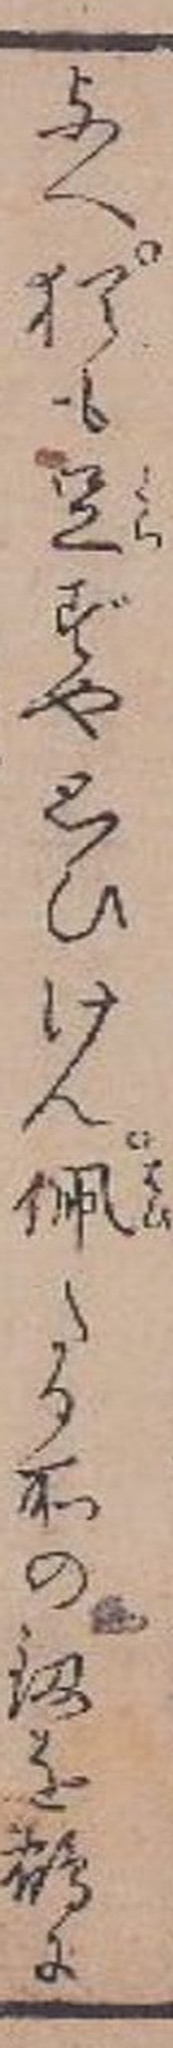与へ、猶も足ずや思ひけん、佩たる所の釼を鶴に
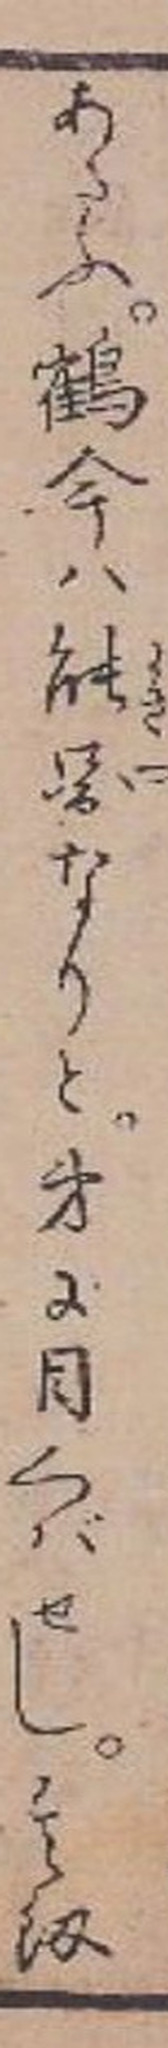あたふ、鶴今は能図なりと、弟に目くばせし、其釼
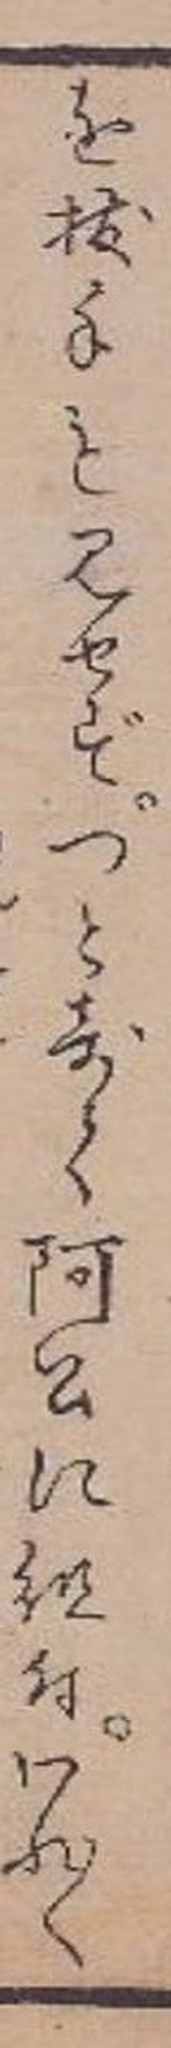を抜手を見せず、つと寄て阿公に組付、われ〳〵
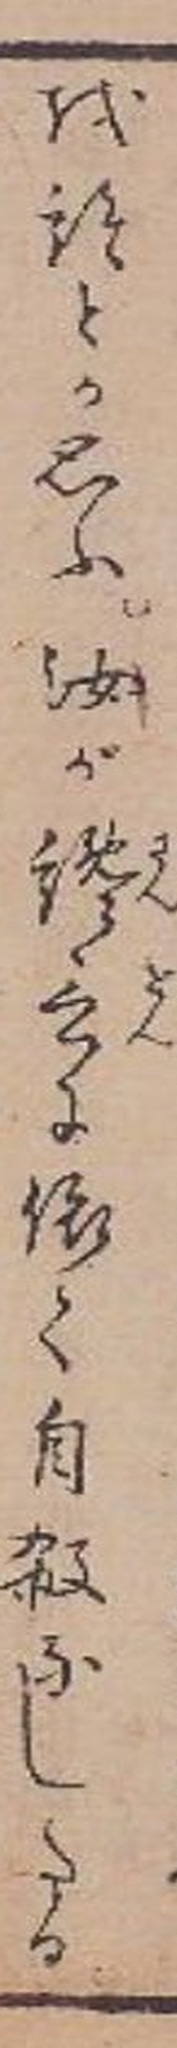を誰とか思ふ、汝が讒言に依て自殺なしたる
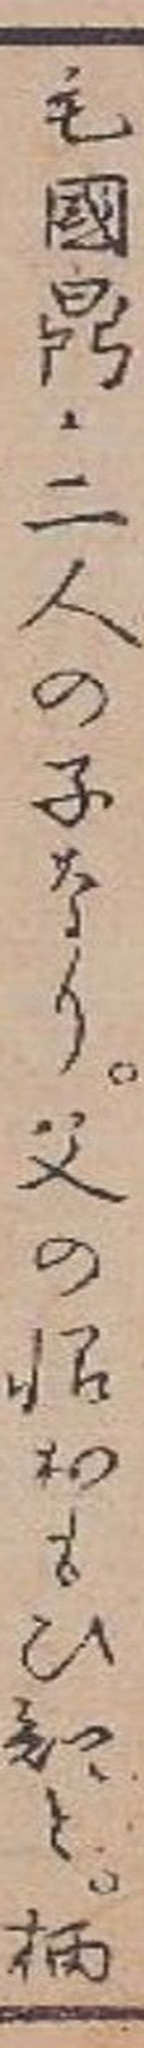毛国鼎か二人の子なり、父の恨おもひ知と、柄
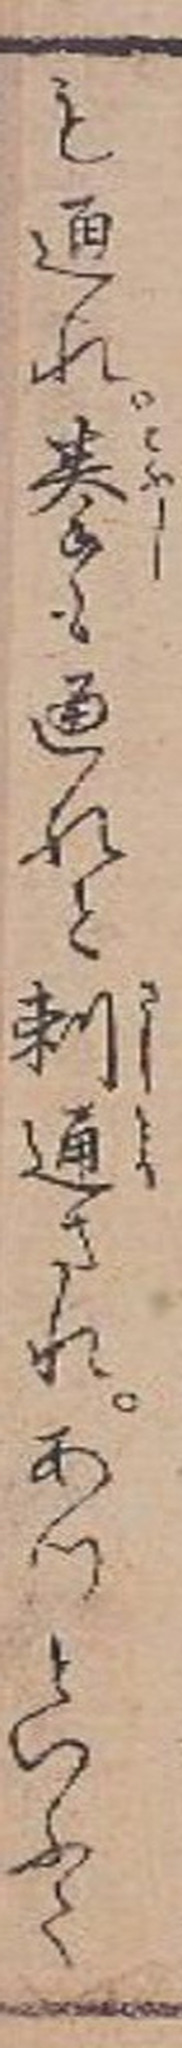も通れ、拳も通れと刺通され、あつといふて
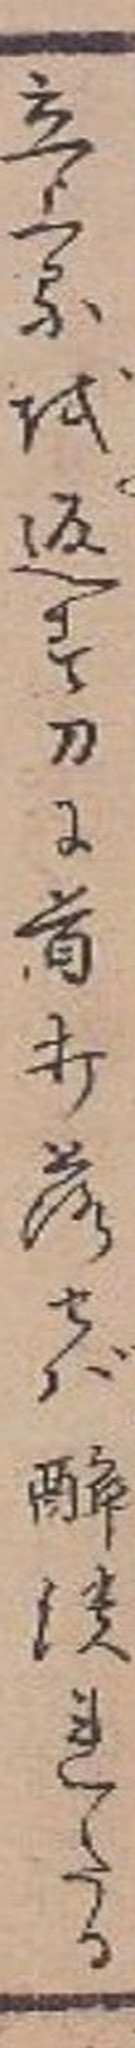立上るを、返す刀に首打落せば、酔潰れたる
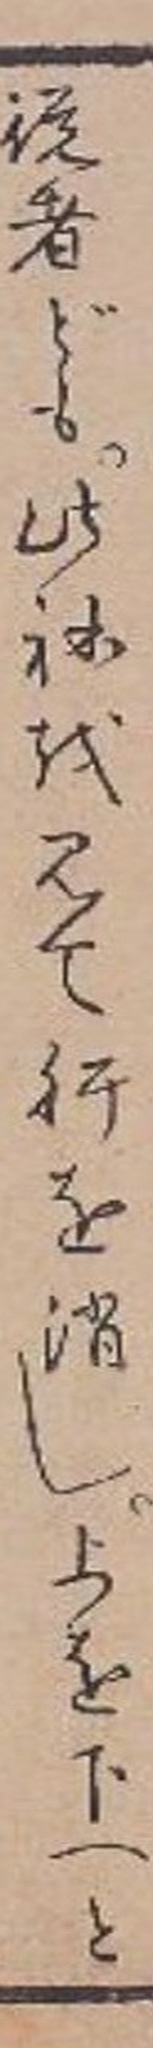従者ども、此体を見て肝を消し、上を下へと
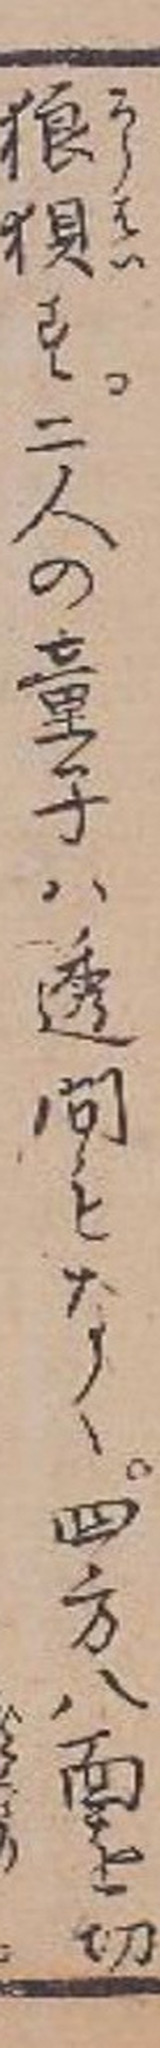狼狽す、二人の童子は透間もなく、四方八面を切
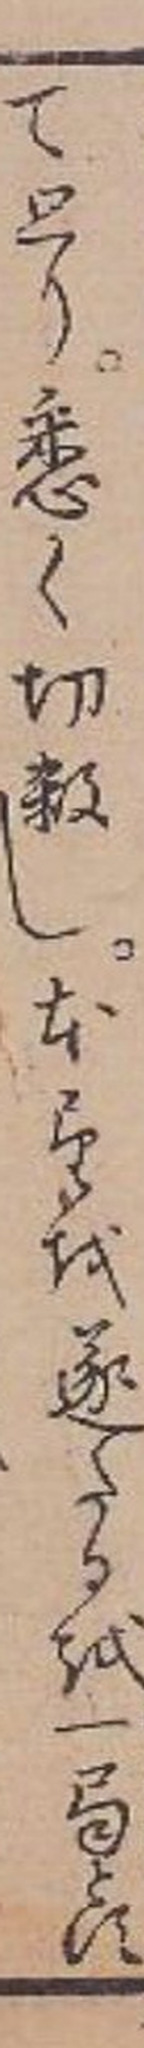て廻り、悉く切殺し、本望を遂たるを一局とす、
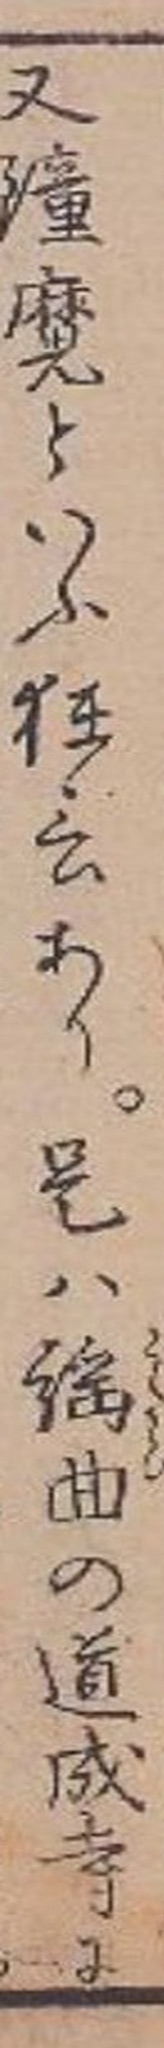又鐘魔といふ狂言あり、是は謡曲の道成寺に
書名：琉球談
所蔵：University of the Ryukyus Library
